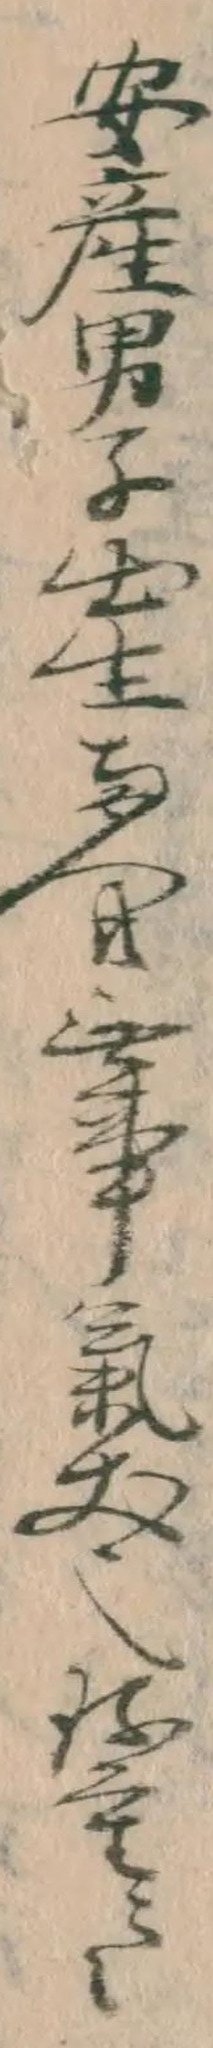安産男子出生両人共無事氣丈也珍重々々
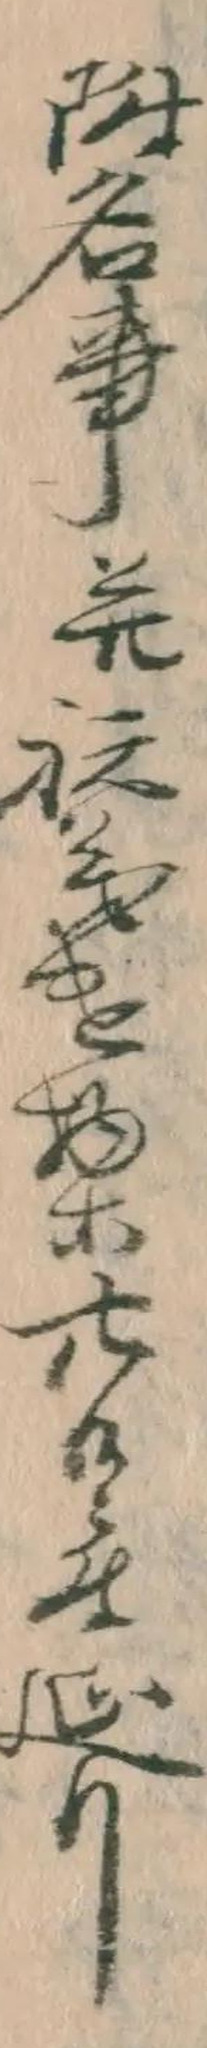附名事幷祝義遣物等廿日ニ付延引
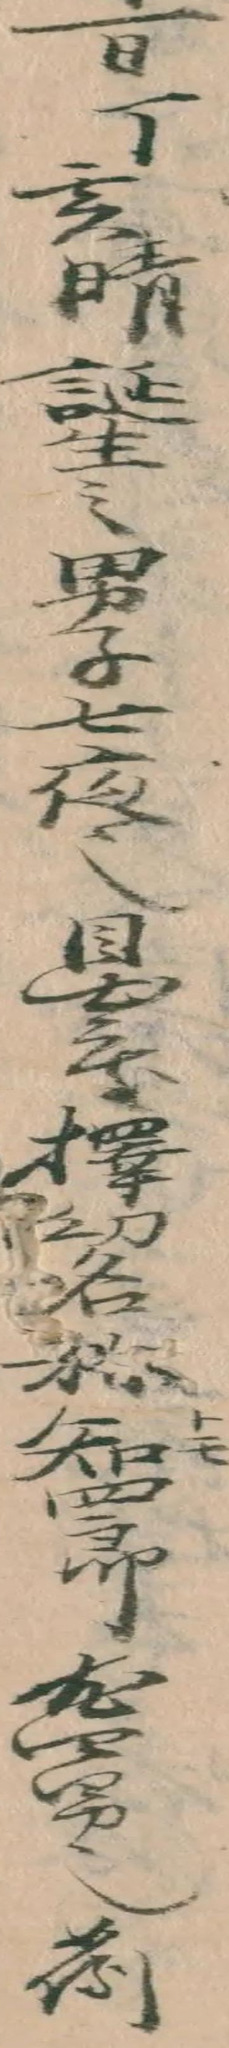廿一日丁亥晴誕生之男子七夜也目出度擇幼名称知四郎尤四男也如例
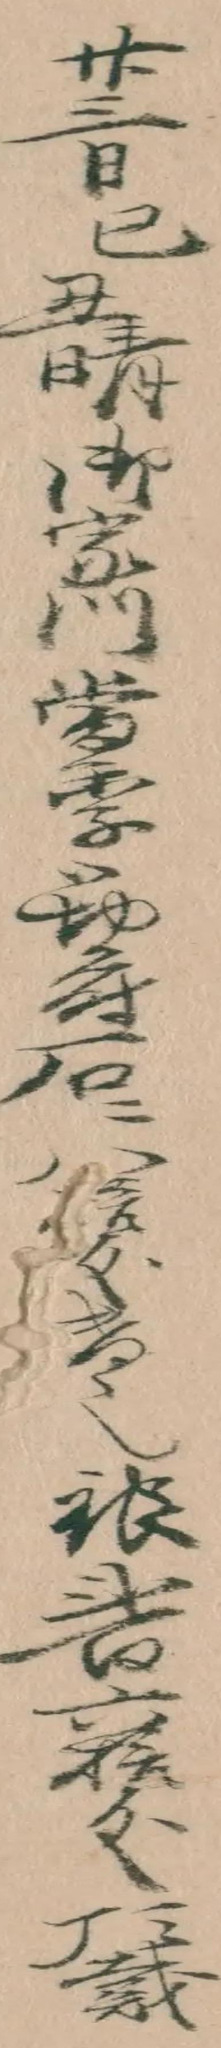廿三日己丑晴御家門當季御切符石二八ヶ分者也銀弐百六拾匁頂戴
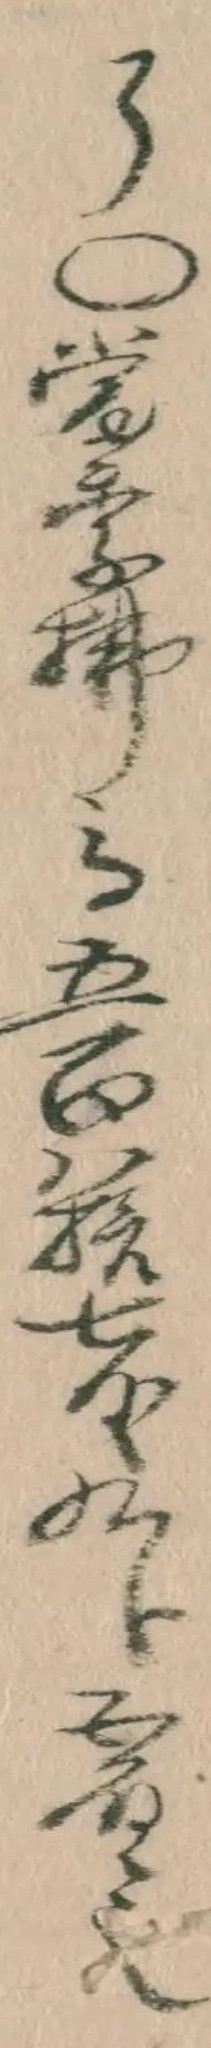了○當季払高五百八拾七匁九分五厘也
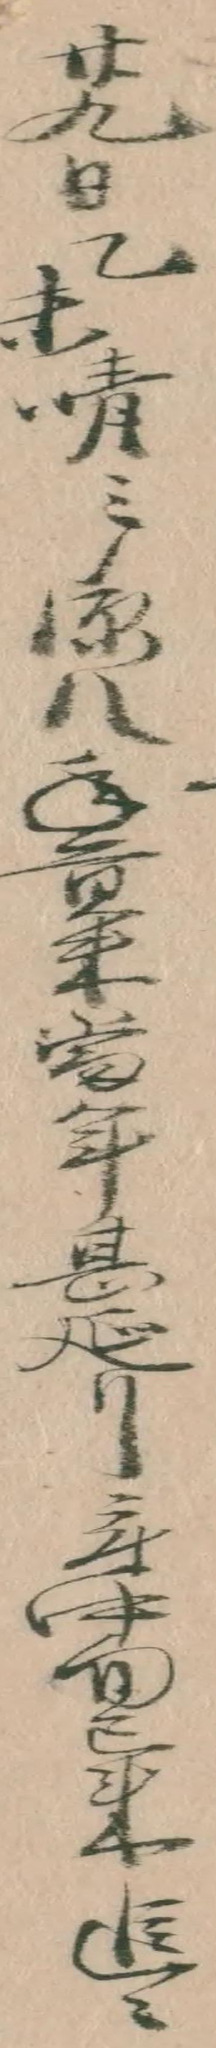廿九日乙未晴之流八年貢米當年甚延引ニ付中旬已来追々
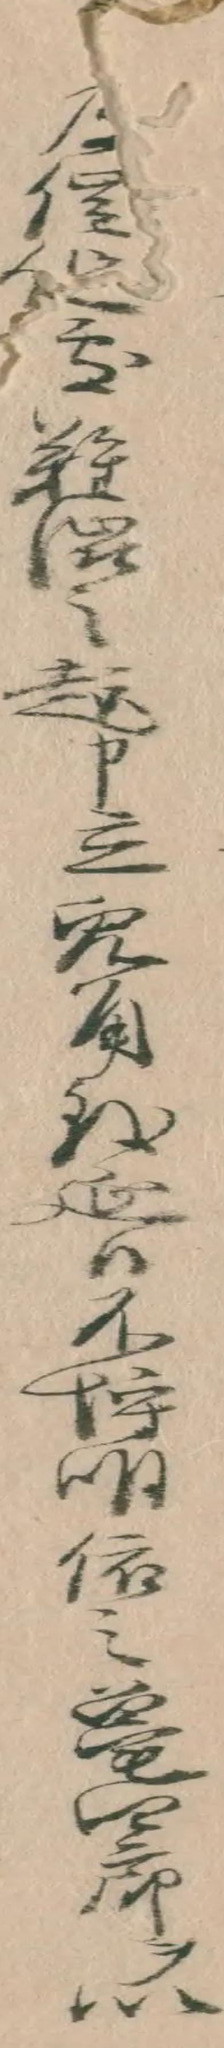為催仕処難渋之趣申立兎角致延日不埒明依之亀四郎ヲ以
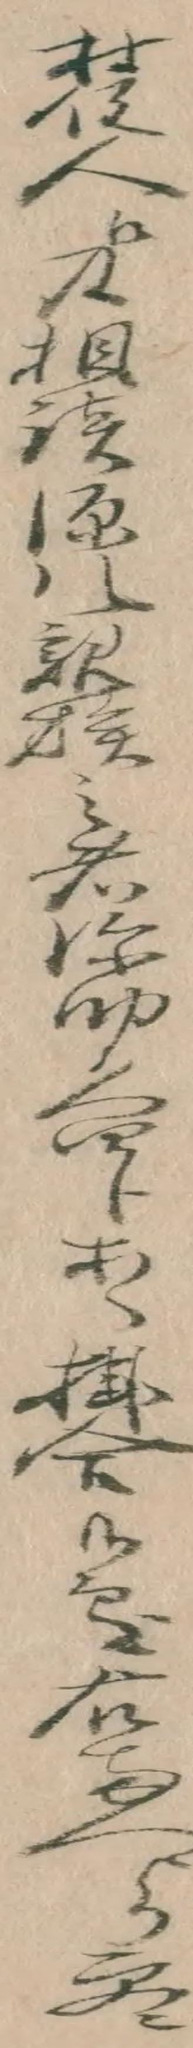村役人江及相談源八親族之者弥助人四分等へ掛合候處右両人より更ニ
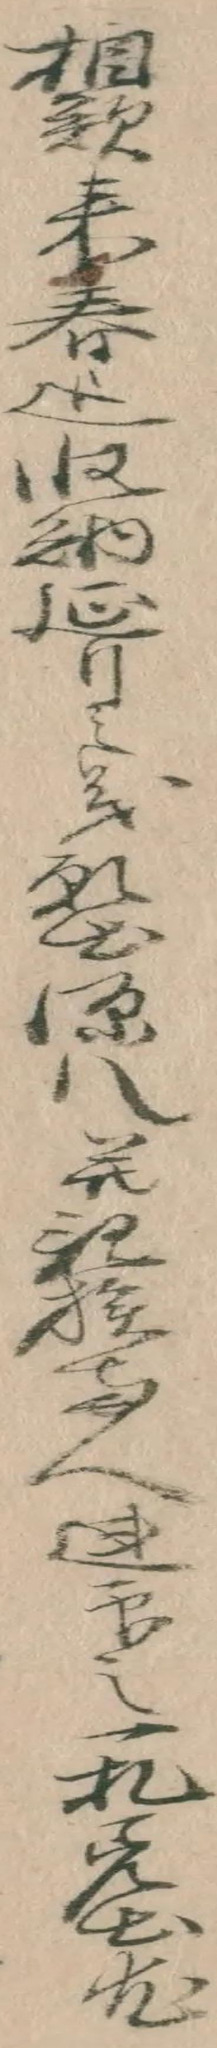相頼来春迄収納延引之義願出源八并親族両人連印之一札差出尤
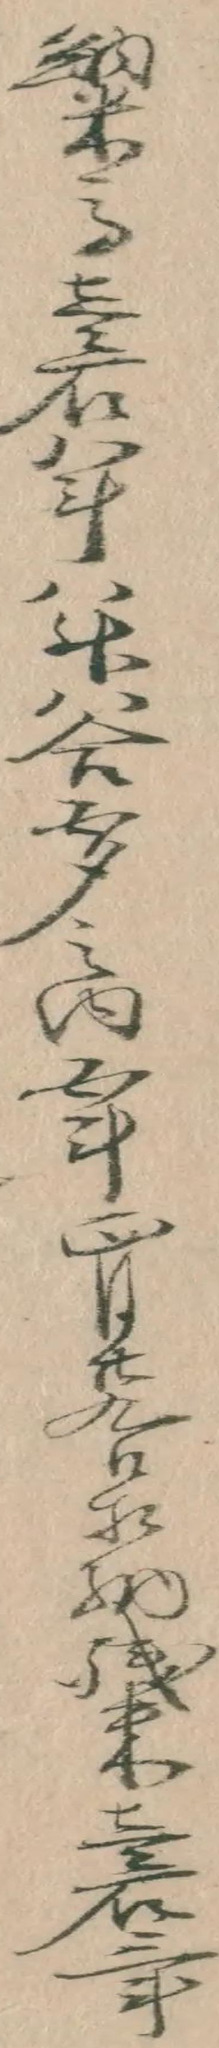納米高壱石八斗八升八合五夕之内五斗正月廿九日相納残米壱石三斗
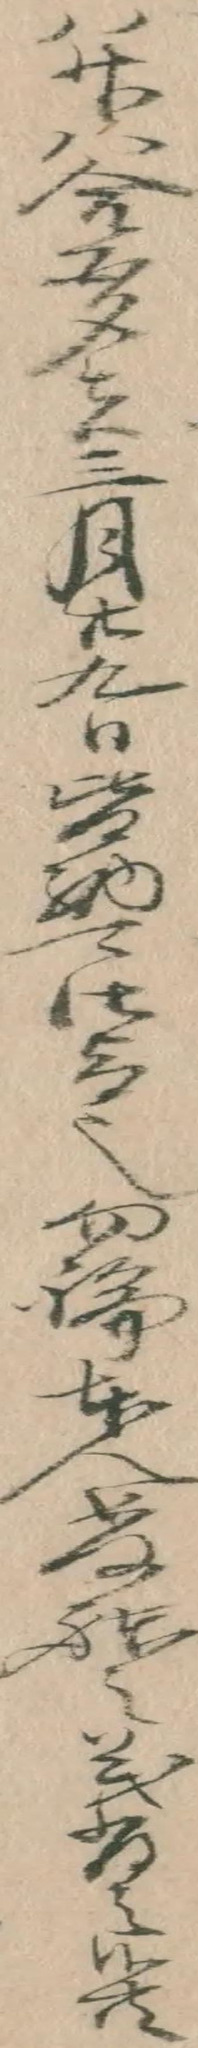八升八合五勺者三月廿九日皆納可仕旨也勿論本人如何躰之義有之候共
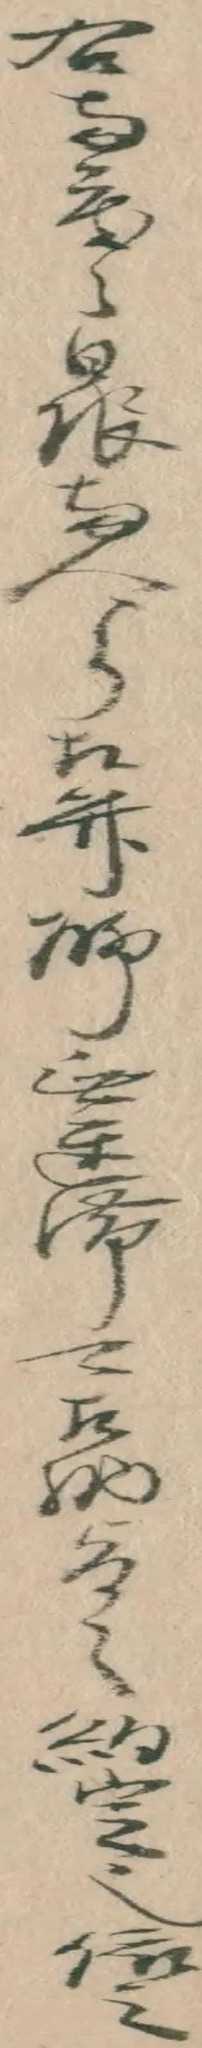右両處之日限両人より相弁聊無遅滞可相納旨之約定也依之
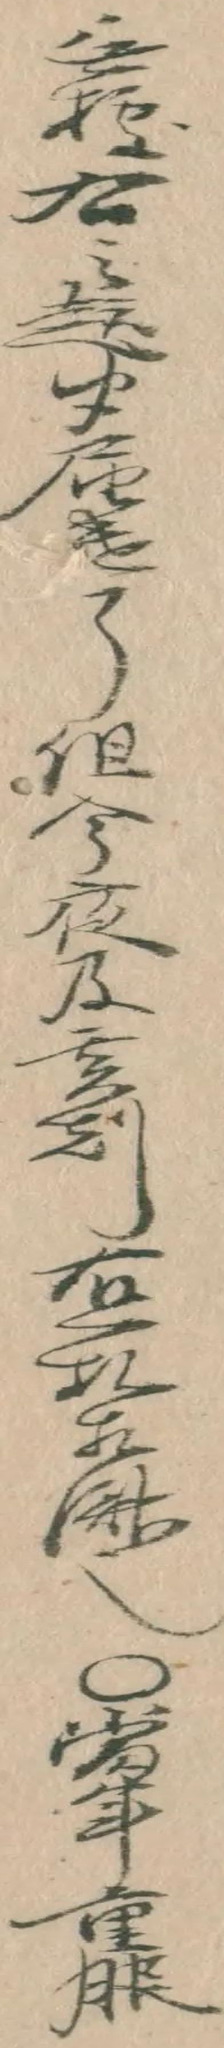無據右之趣聞届遣了但今夜及亥刻右一切相済也〇當年重服
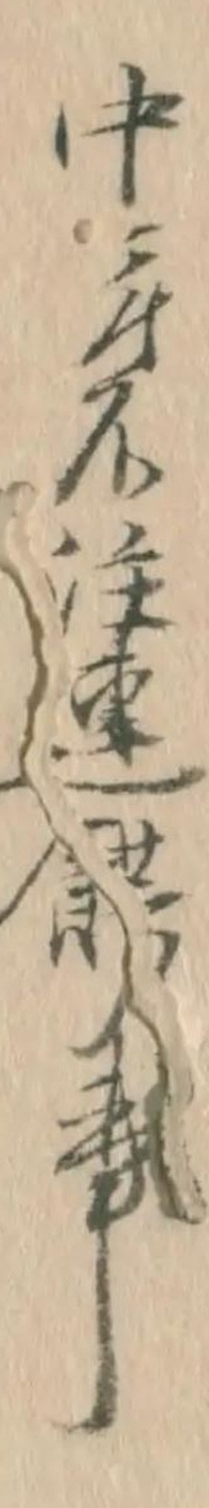中ニ付不注連餝事

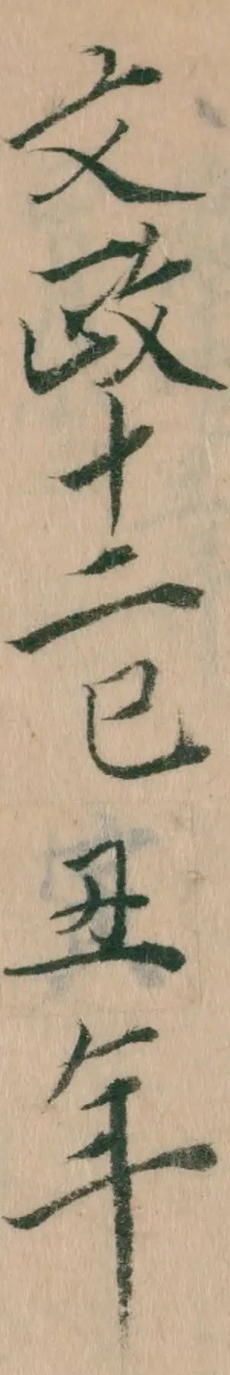文政十二巳丑年
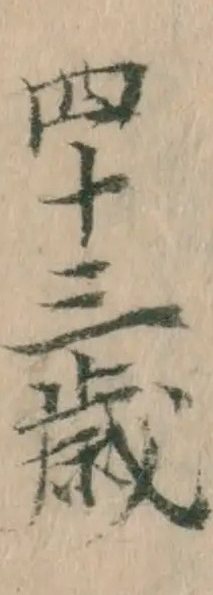四十三歳
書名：賀茂社記録. 第65冊
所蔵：国立国会図書館 National Diet Library, JAPAN
